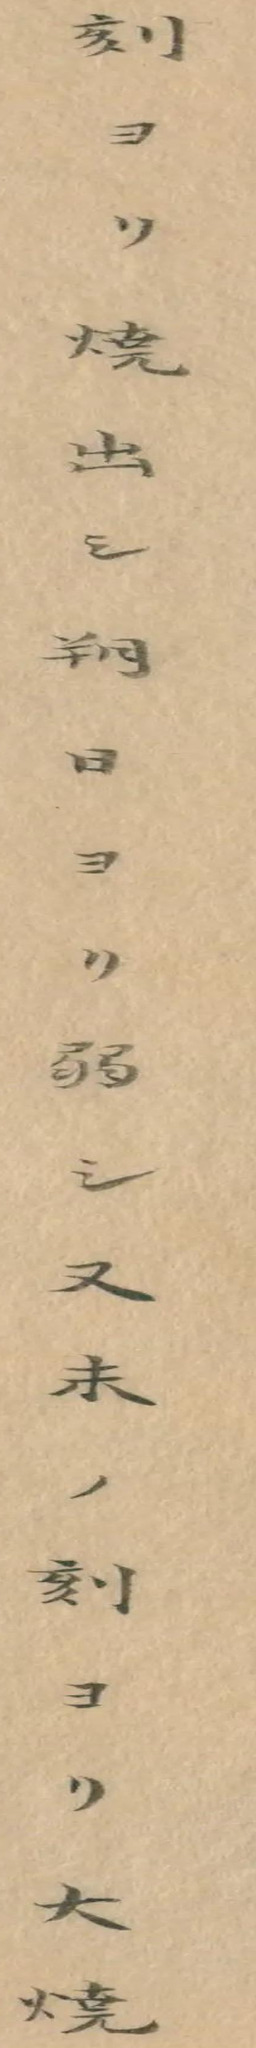刻ヨリ焼出シ朔日ヨリ弱シ又未ノ刻ヨリ大焼
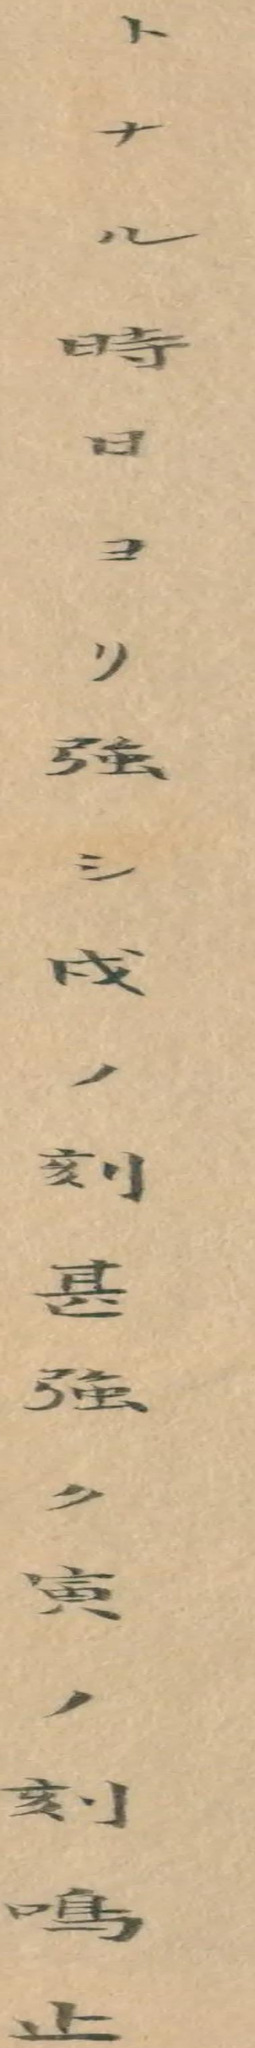トナル時日ヨリ強シ戌ノ刻甚強ク寅ノ刻鳴止

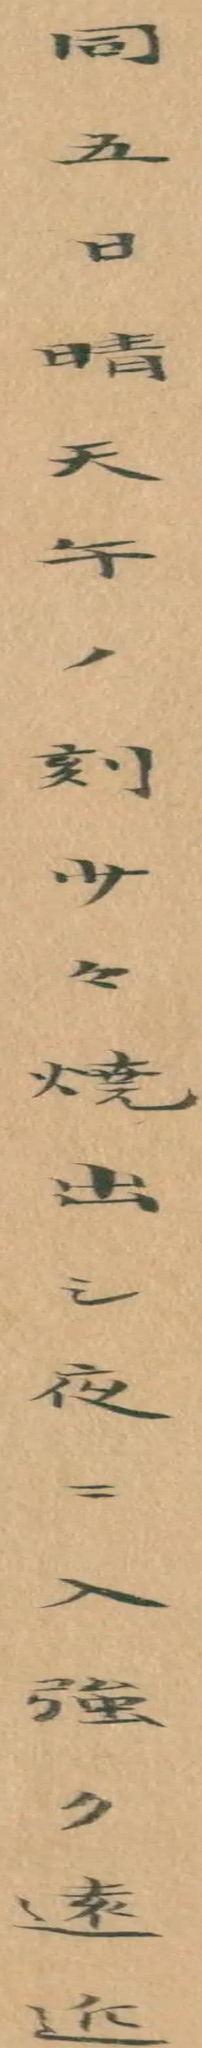同五日晴天午ノ刻少々焼出シ夜二入強ク遠近
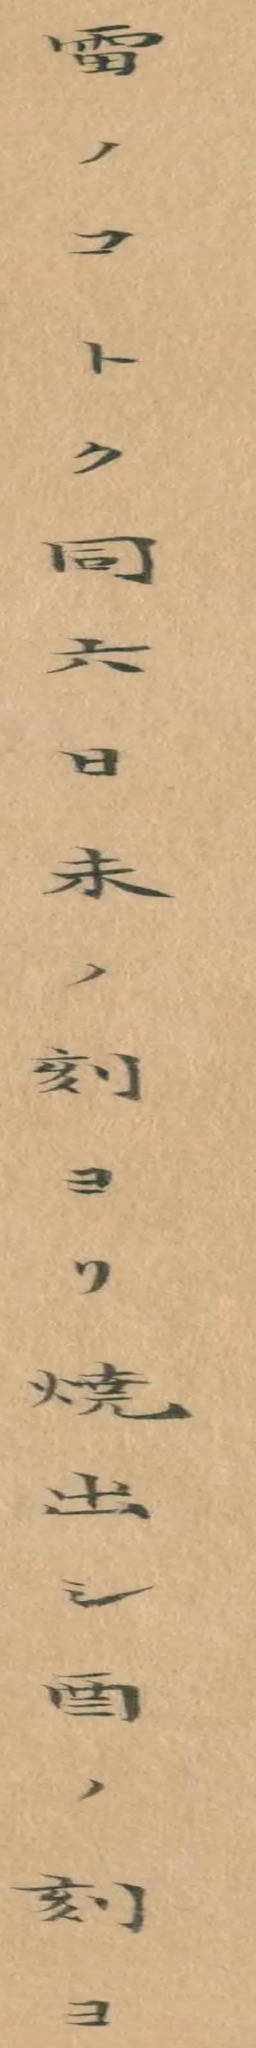雷ノコトク同六日未ノ刻ヨリ焼出シ酉ノ刻ヨ
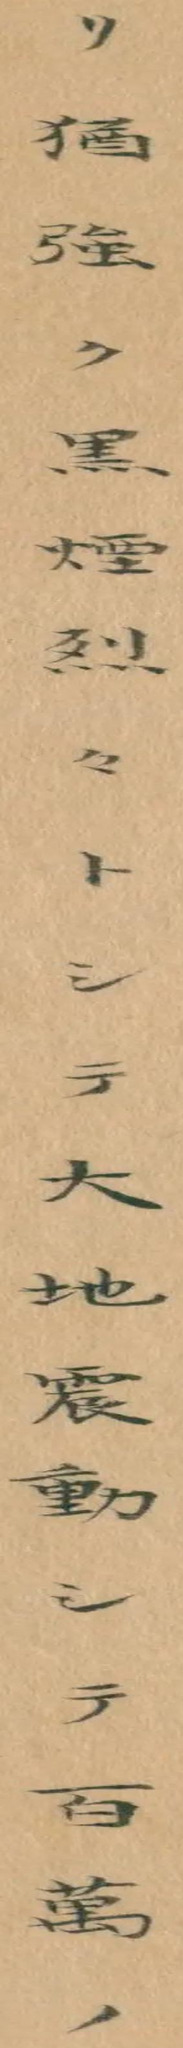リ猶強ク黒煙烈々トシテ大地震動シテ百万ノ
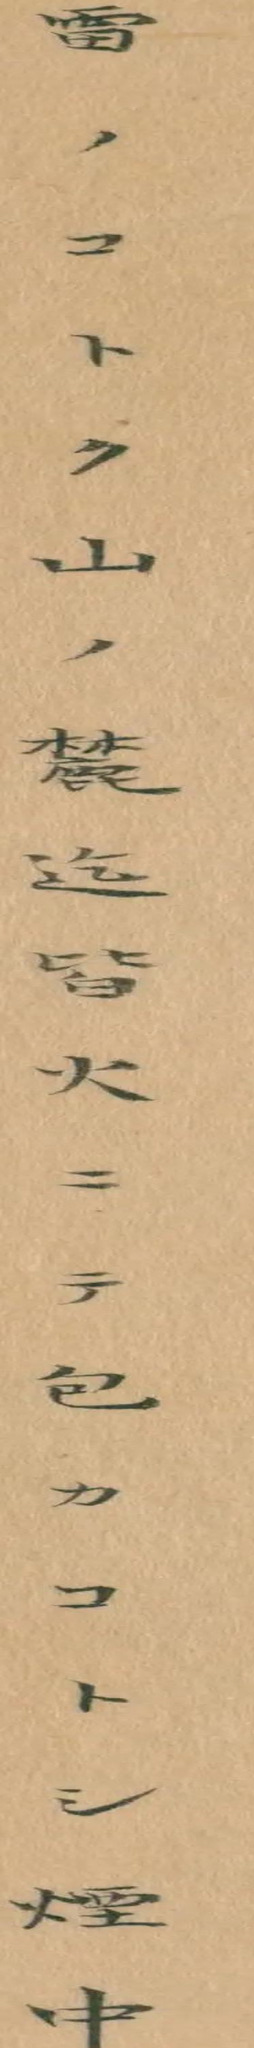雷ノコトク山ノ麓まで火ニテ包カコトシ煙中
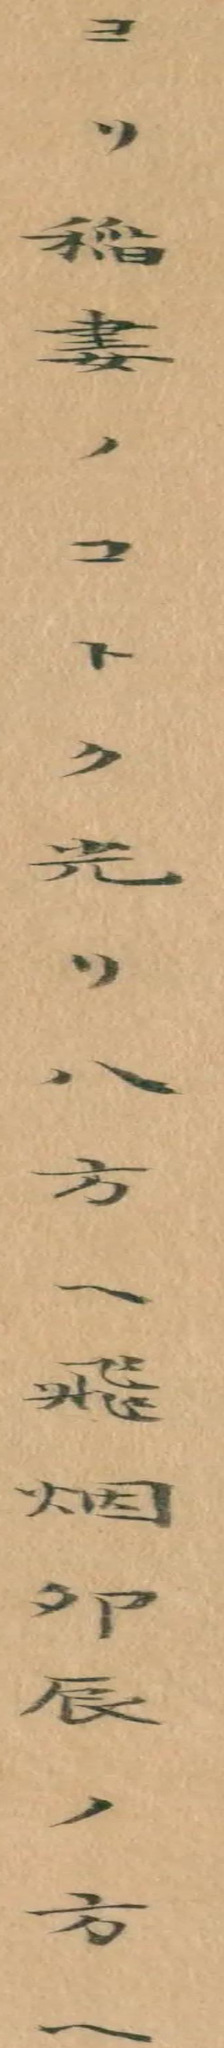ヨリ稲妻ノコトク光り八方へ飛烟卯辰ノ方へ
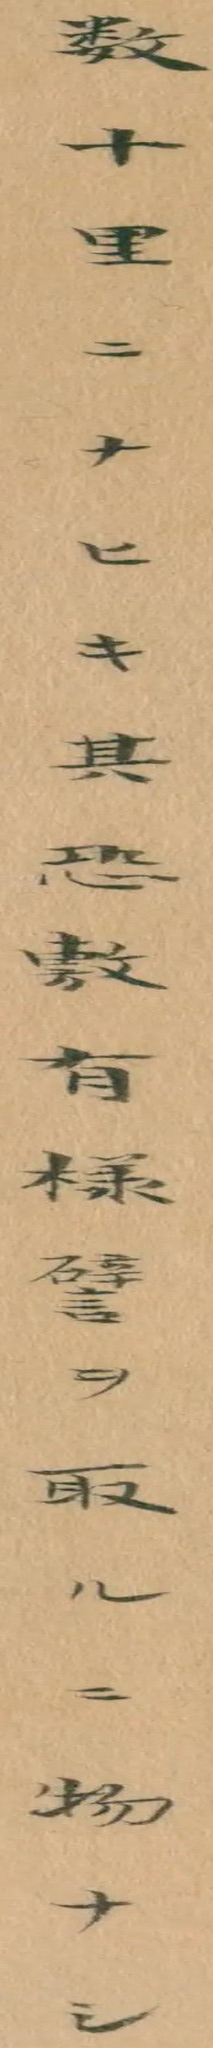数十里二ナヒキ其恐敷有様譬ヲ取ㇽ二物ナシ
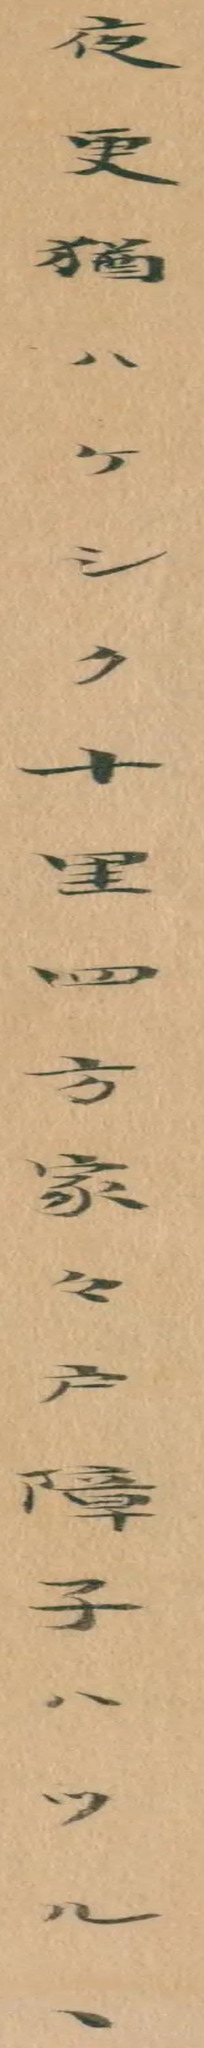夜更猶ㇵケシク十里四方家々戸障子ハツルゝ
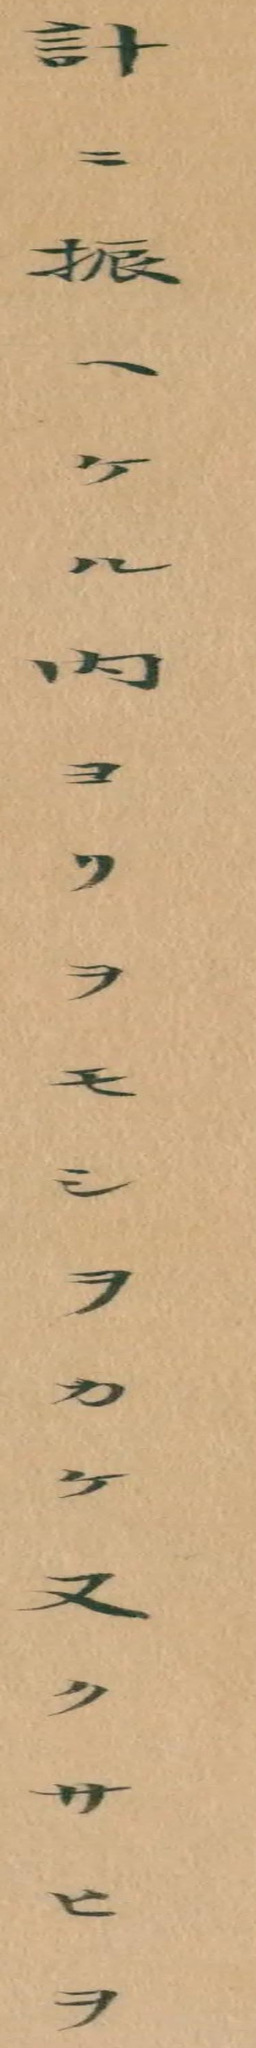計二振へケル内ヨリヲモシヲカケ又クサヒヲ
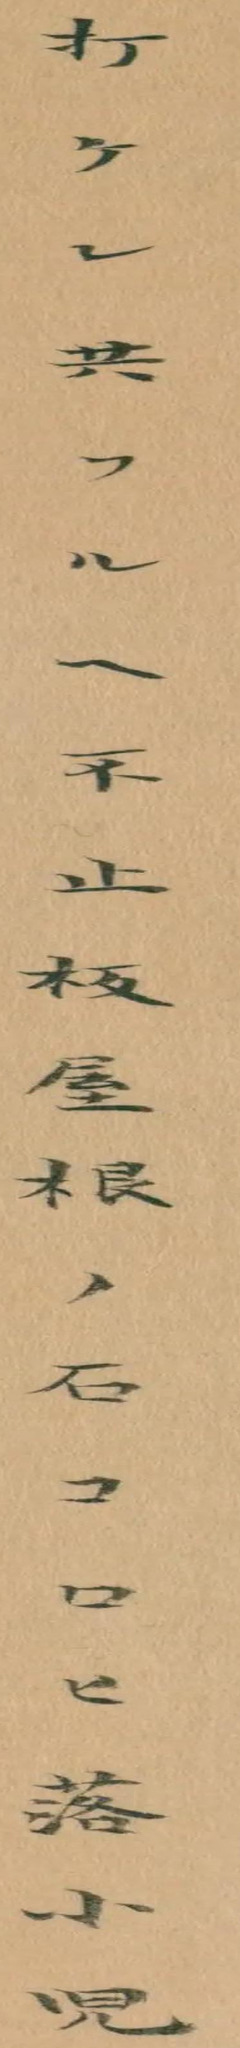打ケレ共フルへ不止板屋根ノ石コロヒ落小児
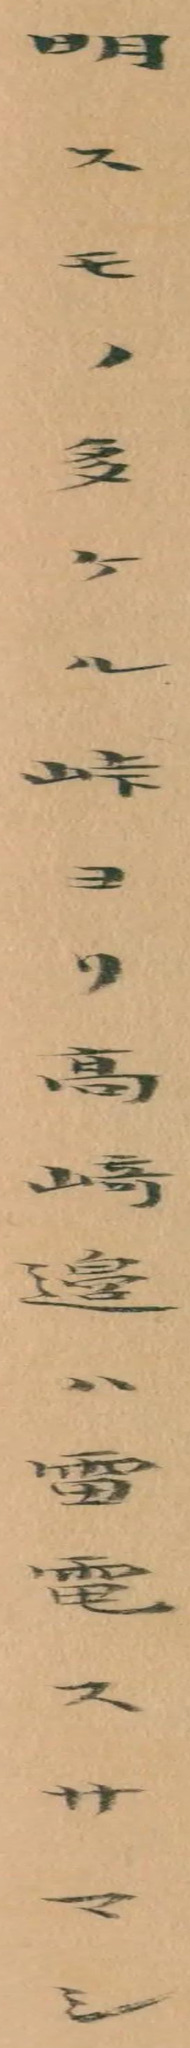明スモノ多ケル峠ヨリ高崎辺ハ雷電スサマシ
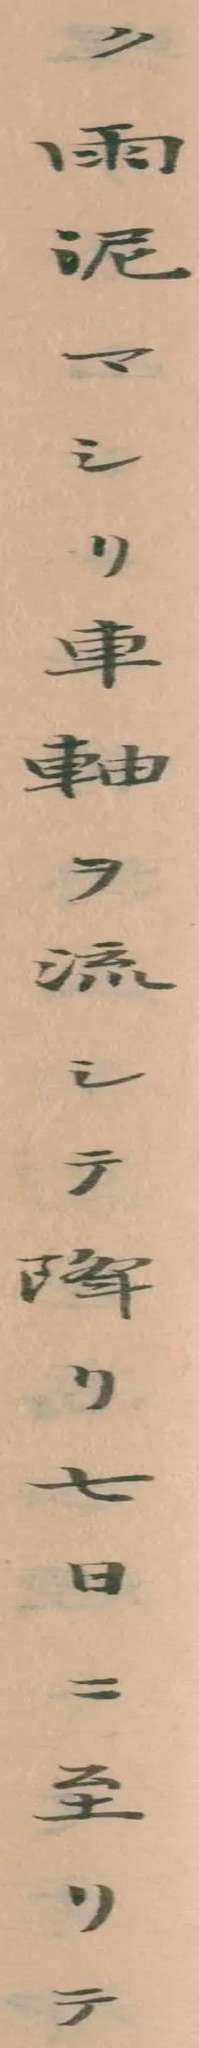ク雨泥マシリ車軸ヲ流シテ降り七日二至りテ
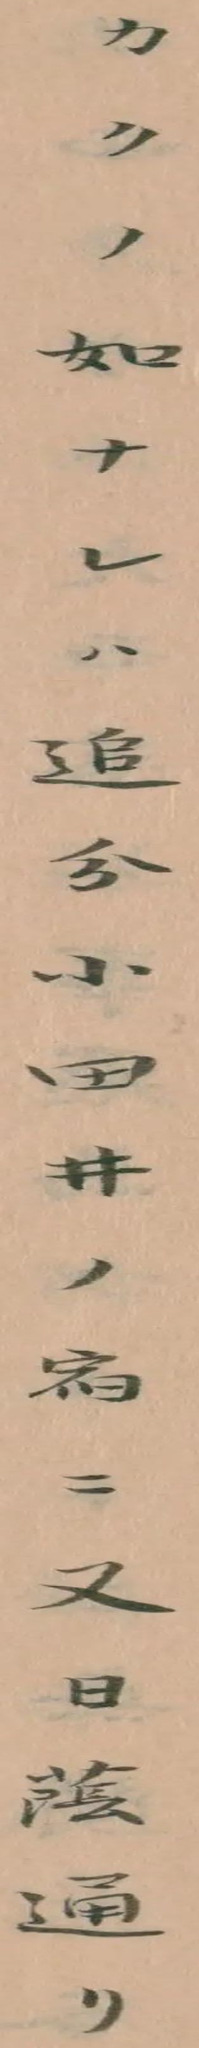カクノ如ナレハ追分小田井ノ宿二又日蔭通リ
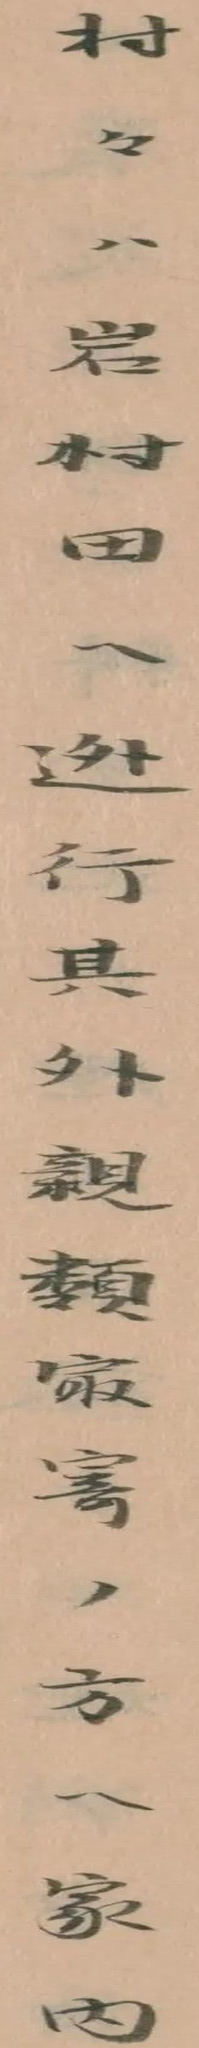村々ハ岩村田へ逃行其外親類最寄ノ方へ家内
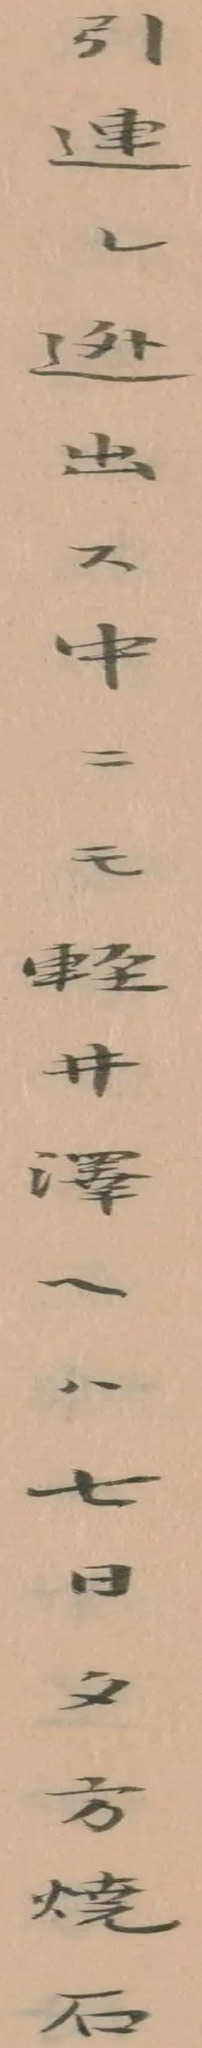引連レ逃出ス中ニモ軽井沢へハ七日夕方焼石
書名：地災撮要. 巻3(地震之部)-巻4(噴火之部)
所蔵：国立国会図書館 National Diet Library, JAPAN
